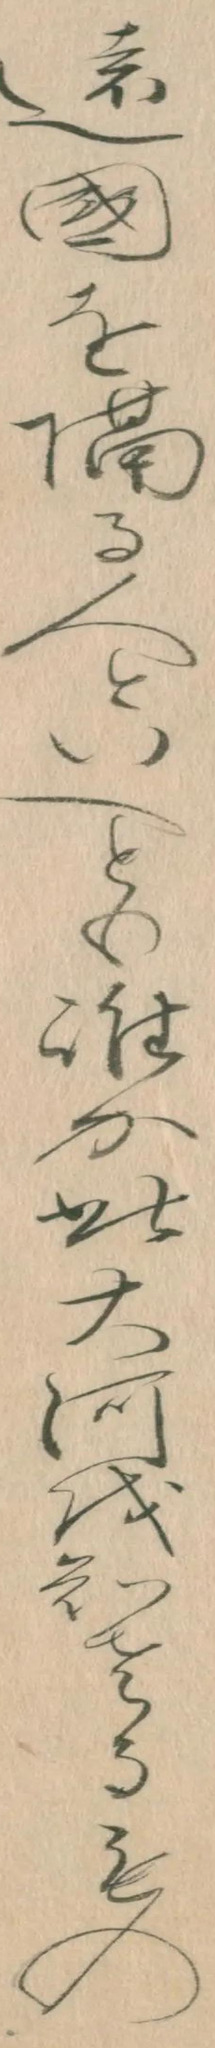遠国を備る人といへとも誰か此大河を知さるもの
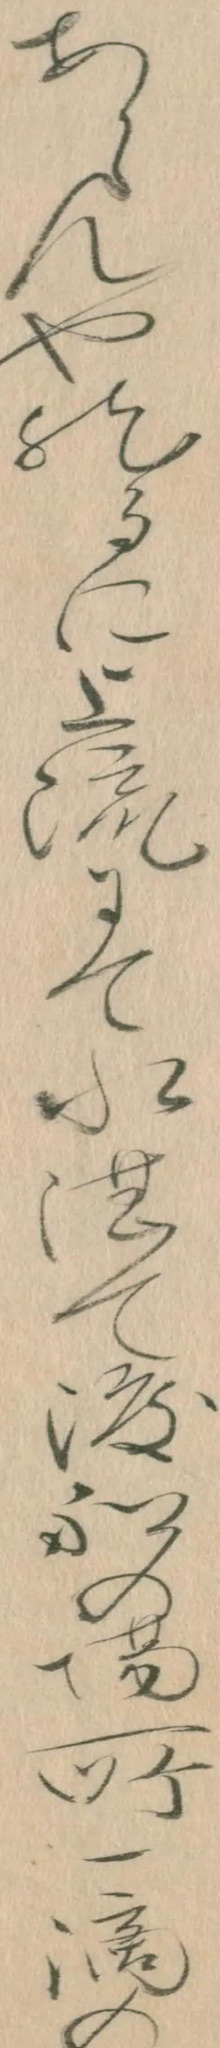あらんや然るに上流にて水湛て渡船の場所一滴の
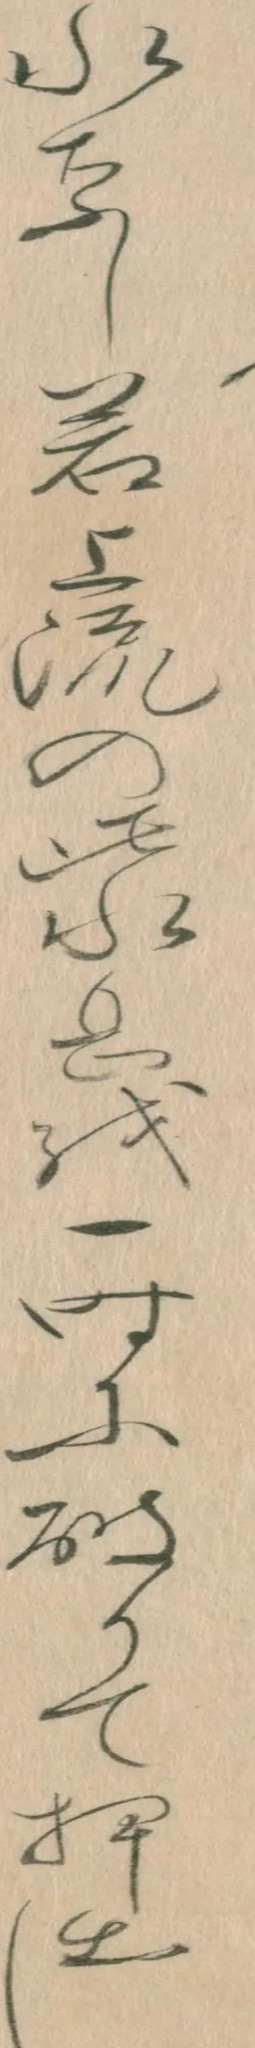水なし若上流の此水息を一時に破りて押出し
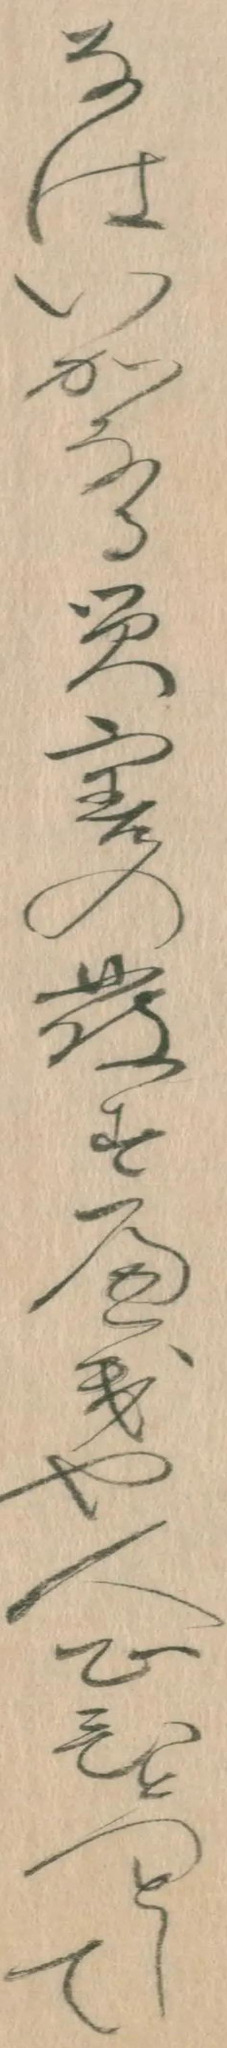なはいかなる災害の発すへきや人心ひとつとして
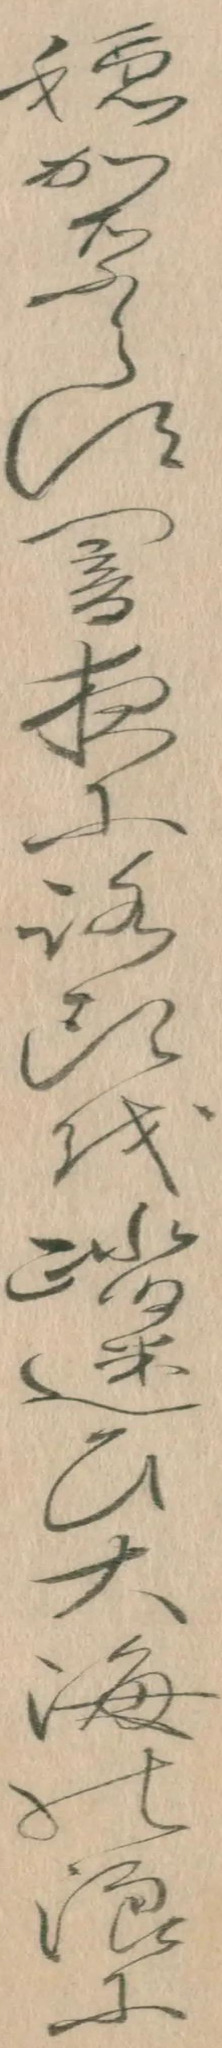穏かならす闇夜に路頭を踏迷ひ大海の浪に
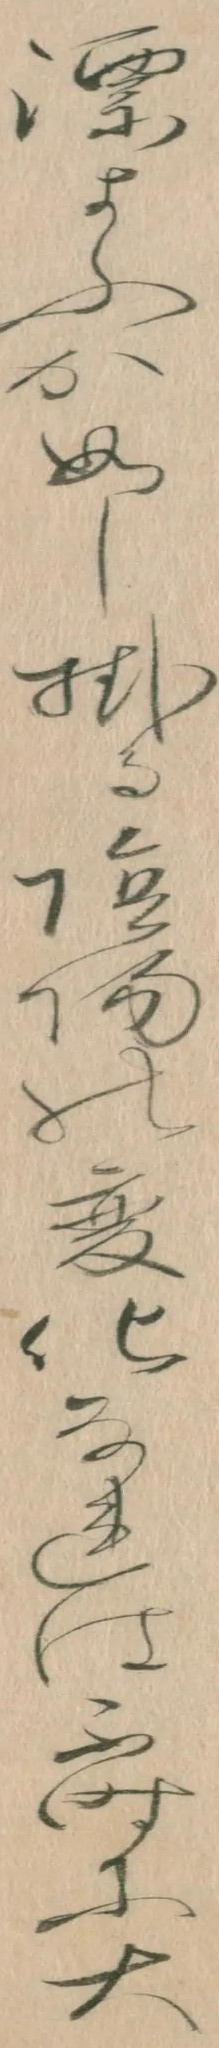漂よふか如し掛る壇場の変化なれは不時に大
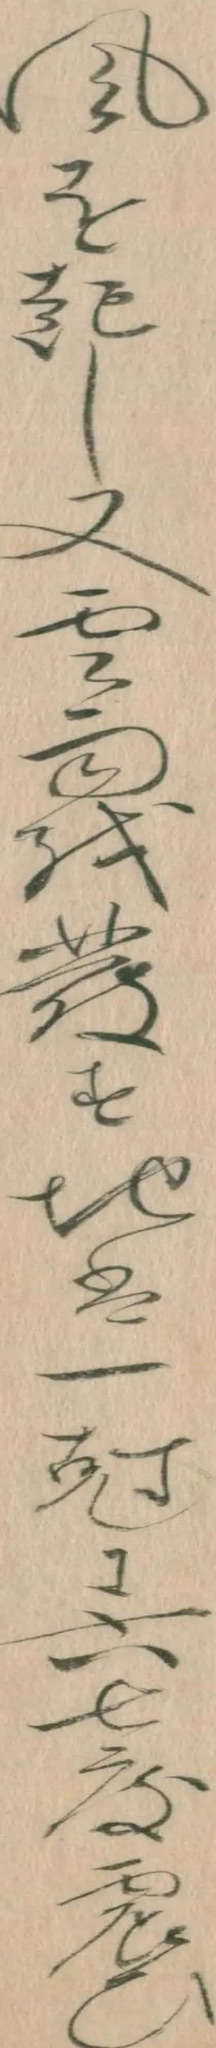風を起し又雲雨を発す地は一剋に六七度震ひ
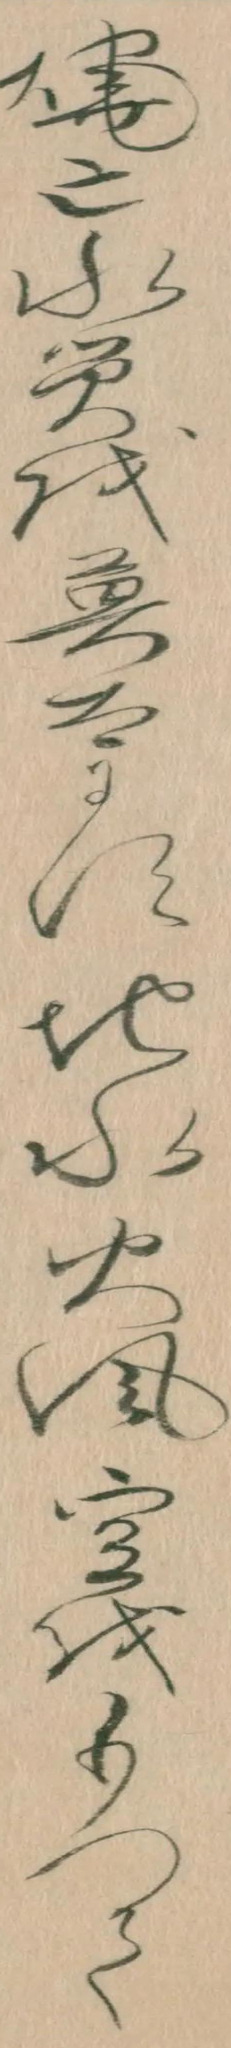焼亡水災を莫太にす地水火風空をもつて
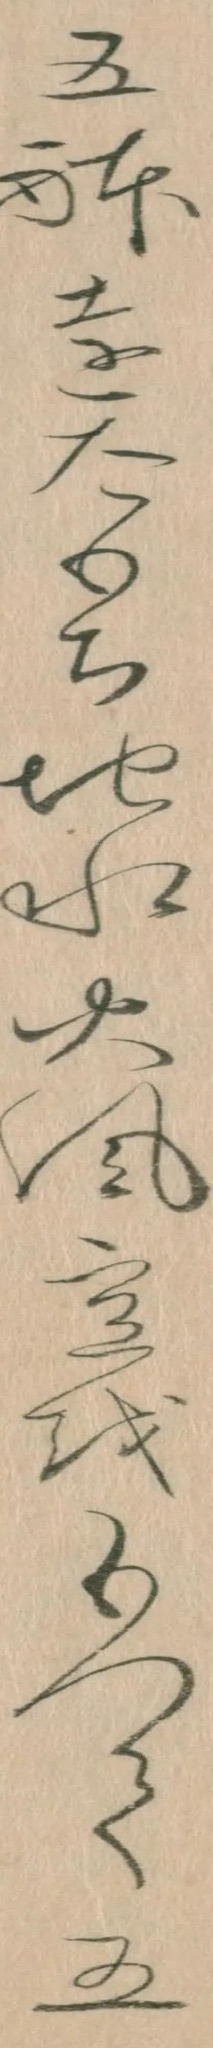五躰をたもち地水火風空をもつて五
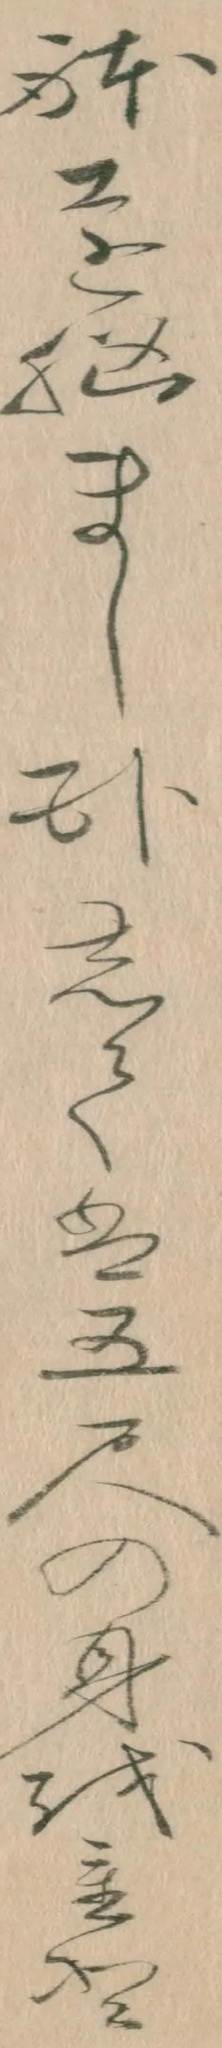躰を脳まし臥しては五尺の身を置と
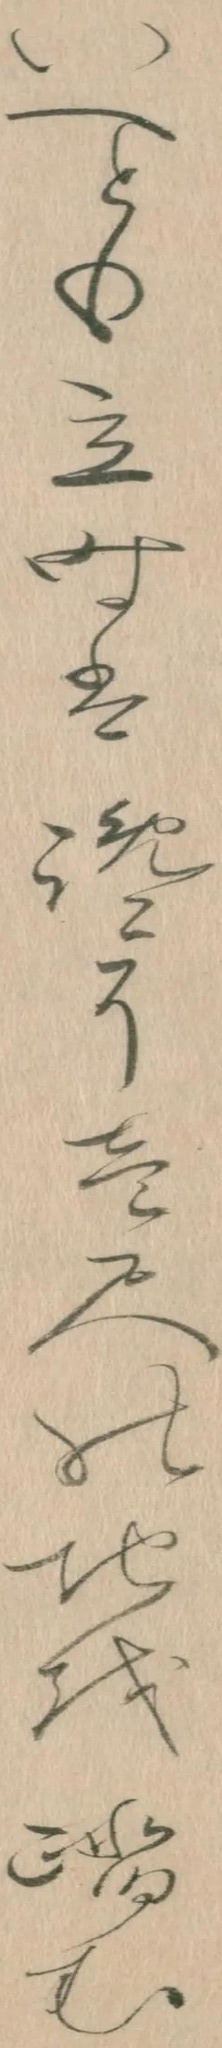いへとも立時は纔に壱尺の地を踏む
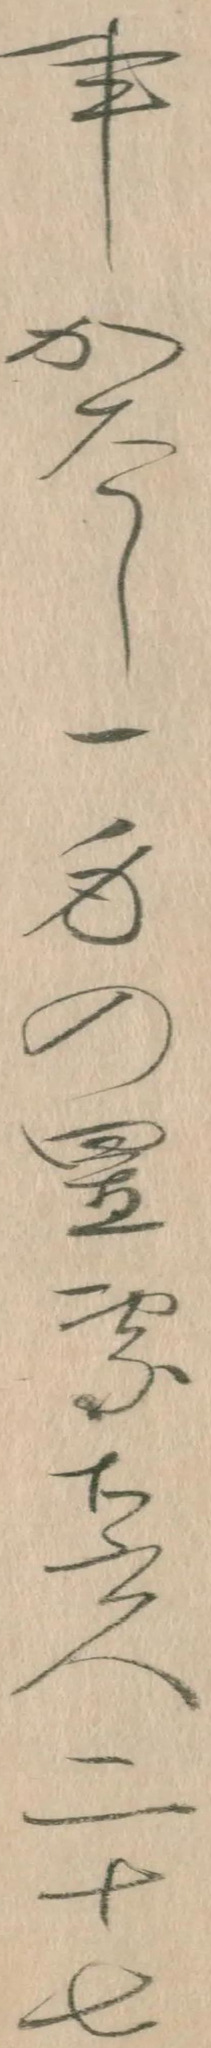事かたし一身の置處なく二十七
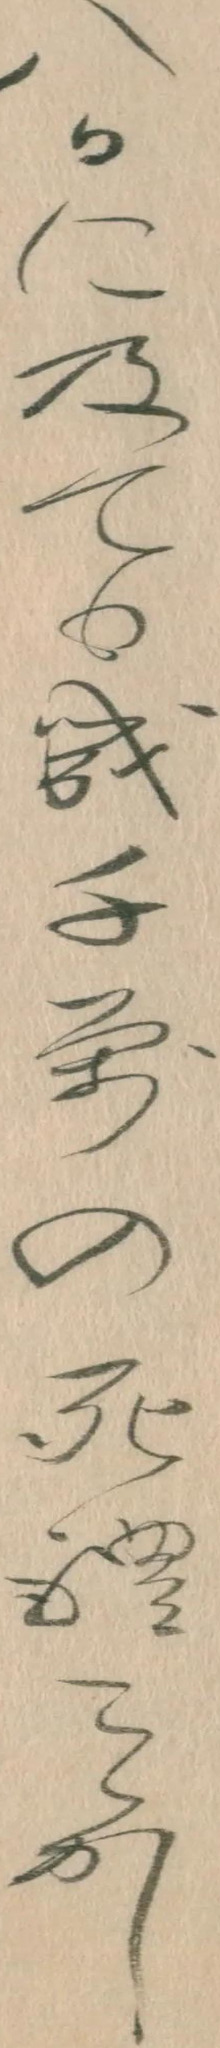八日に及ても幾千万の死躰こゝかし
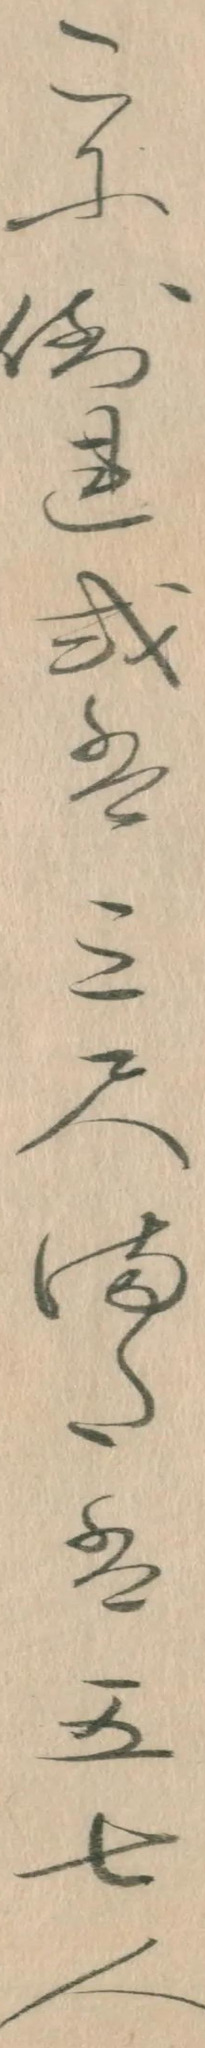こに倒れ或は三尺または五七人
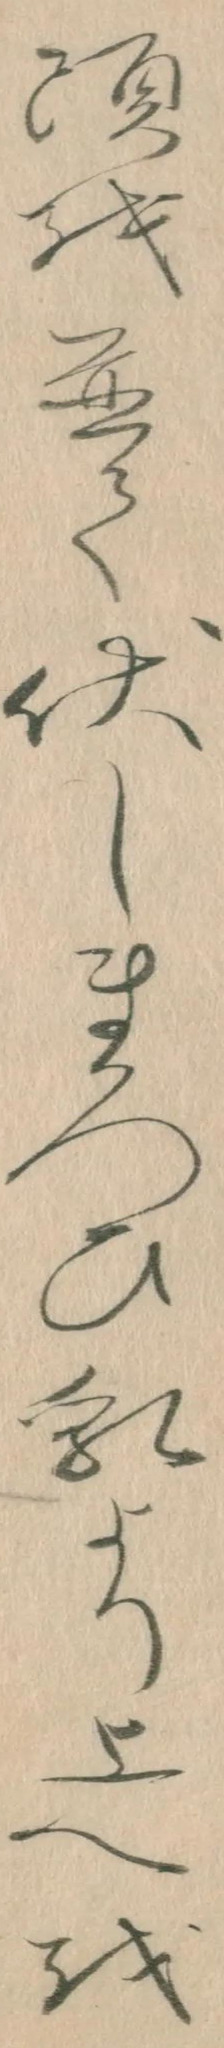頭を並て伏しまつひ乳より上へを
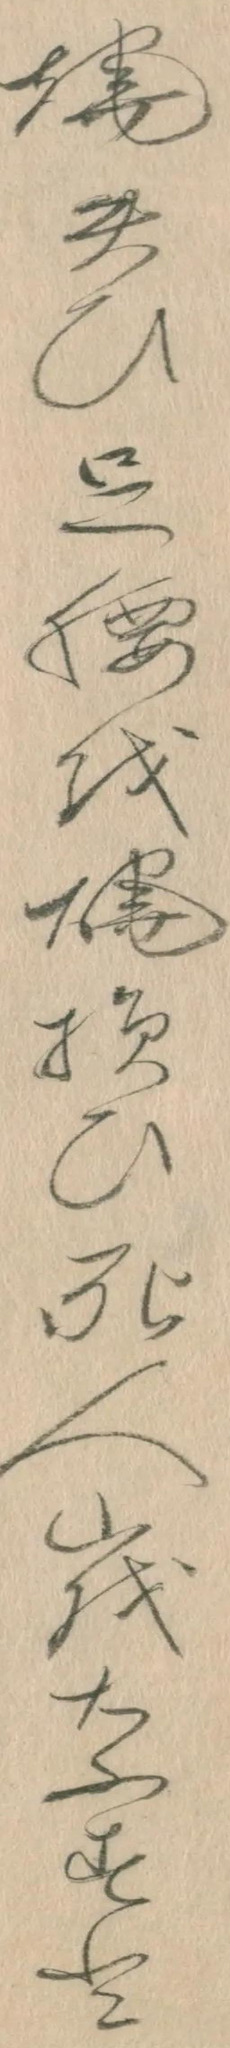焼失ひ足腰を焼損ひ死人山をなすと
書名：俗語之種. [5]
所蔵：国立国会図書館 National Diet Library, JAPAN
